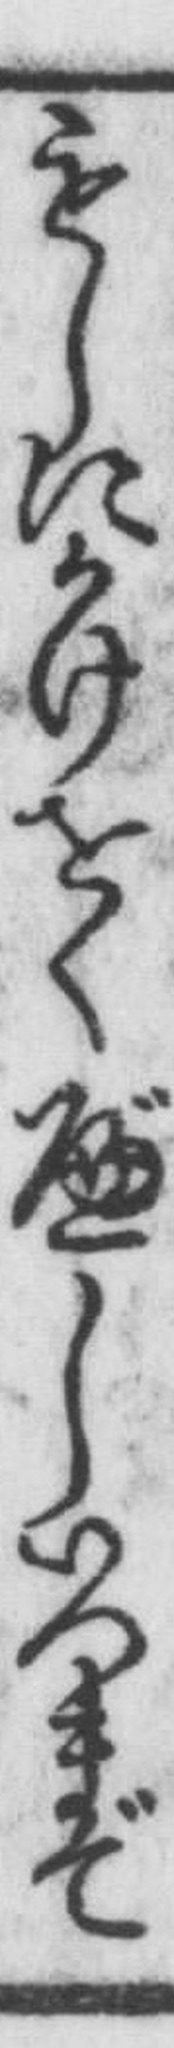もしにかけをくべしいつまで
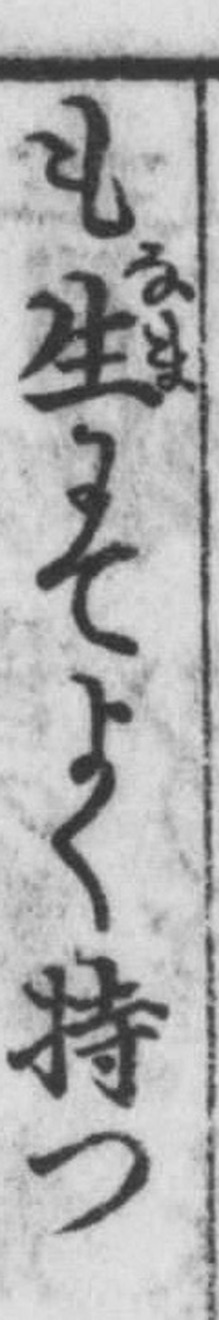も生にてよく持つ
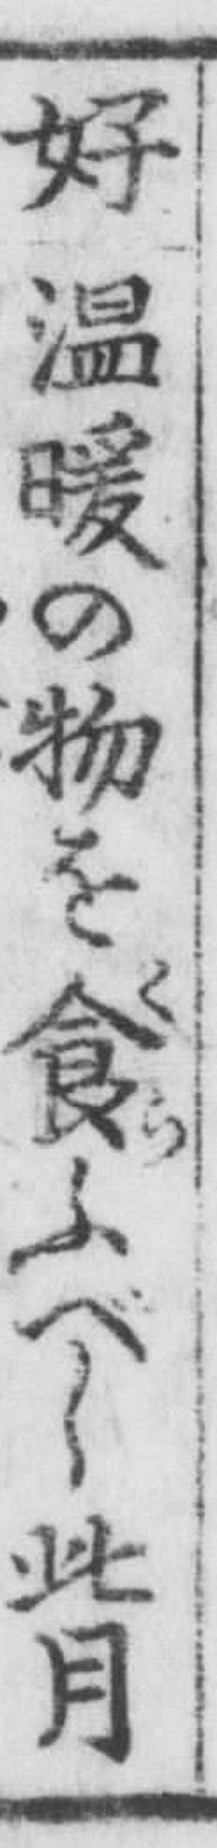好温暖の物を食ふべし此月
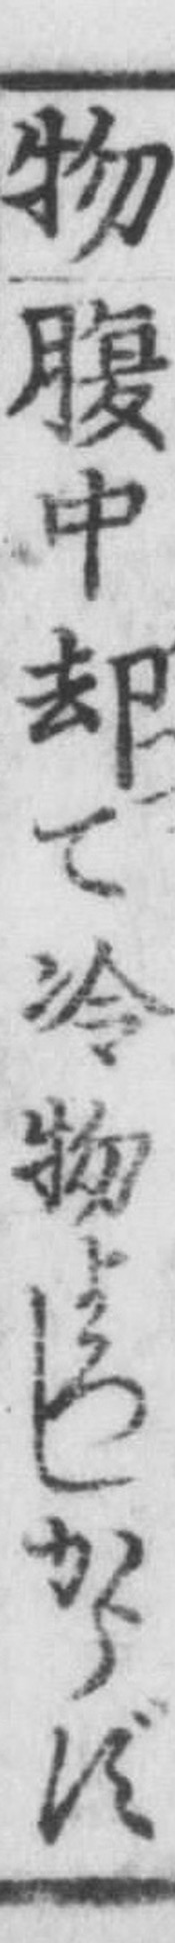物腹中却て冷物よろしからず
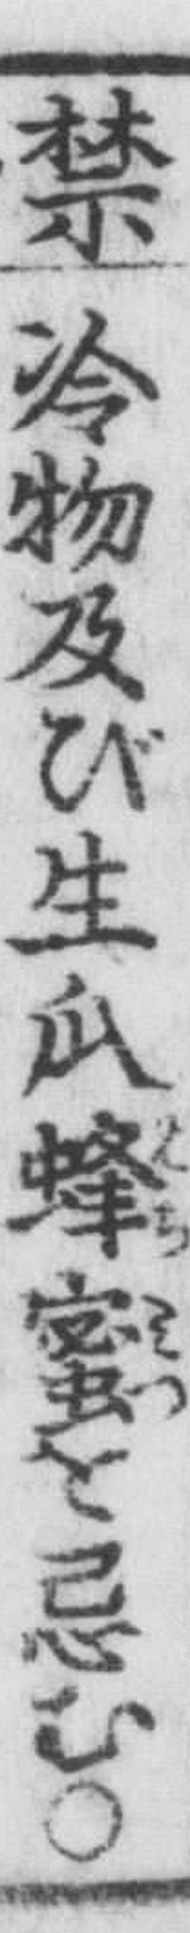禁冷物及び生瓜蜂蜜を忌む〇
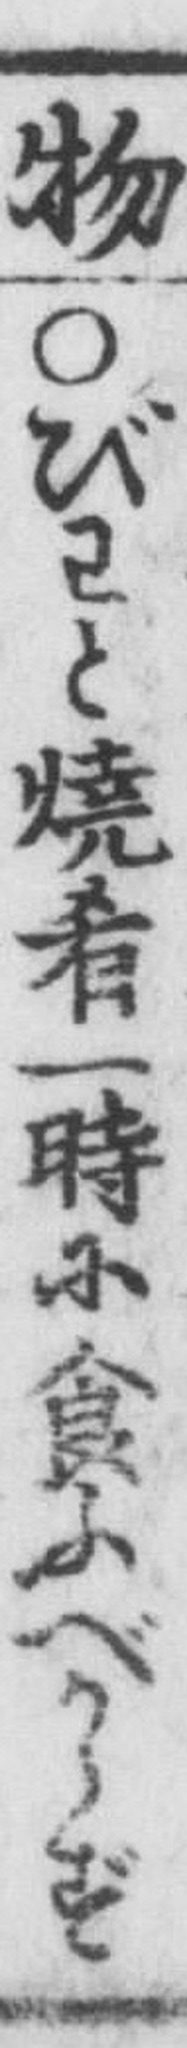物〇びわと焼肴一時に食ふべからず
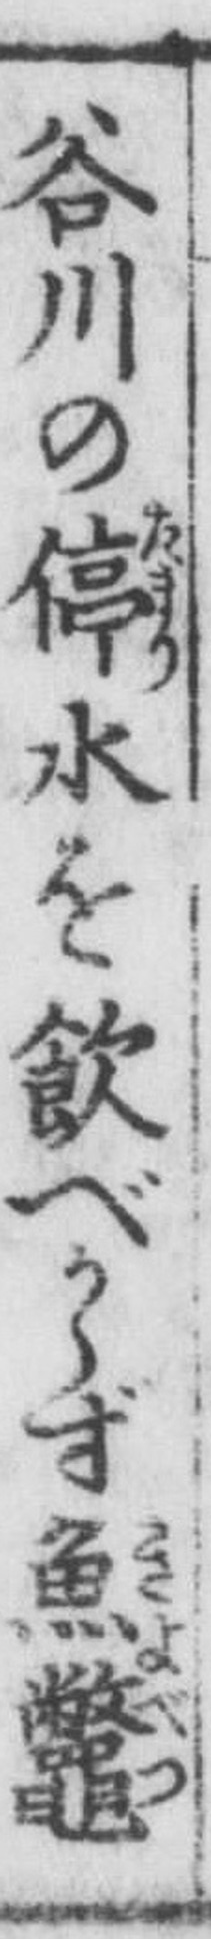谷川の停水を飲むべからず魚鼈
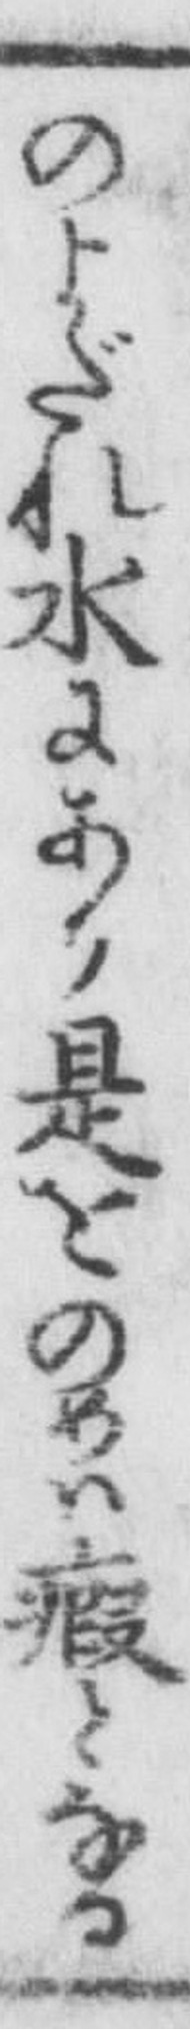のよごれ水にあり是をのめハ疵となる
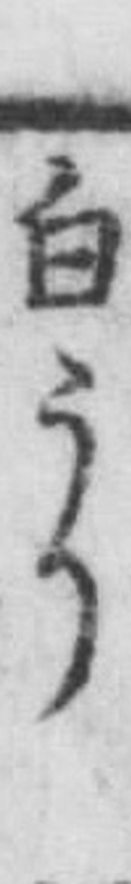白うり
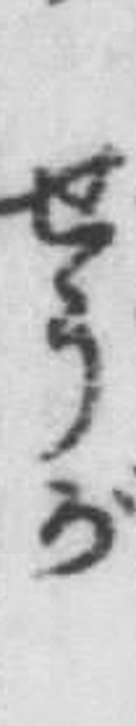せうが
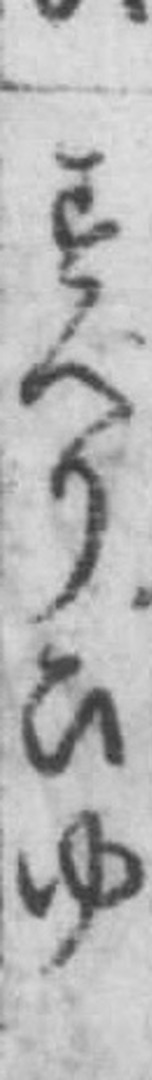すべりひゆ
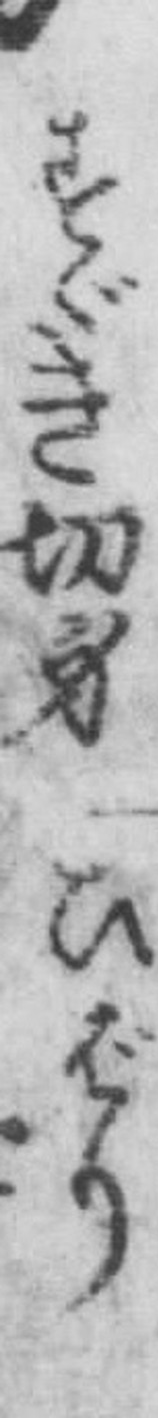すゞき切身ひばり

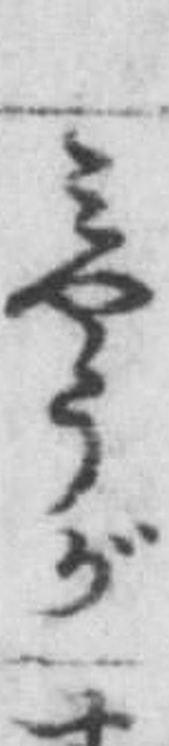ミやうが
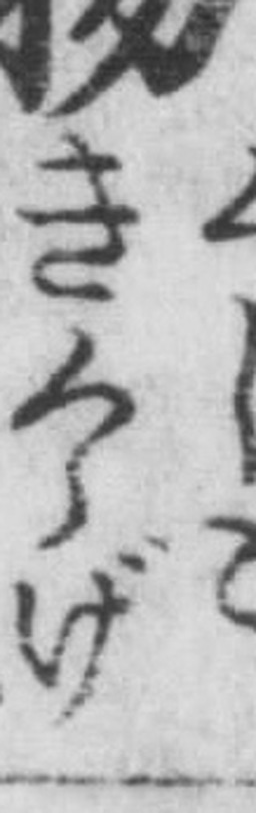きくらげ
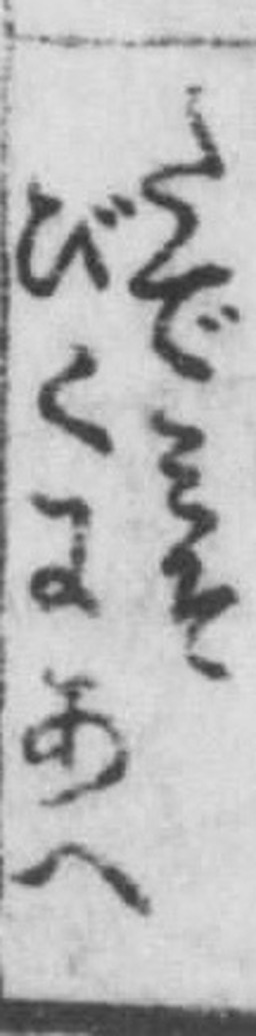びくにあへ
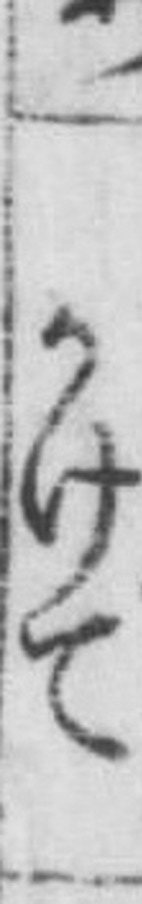かけて
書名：当世料理筌
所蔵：大阪府立大学学術情報センター 国文学研究資料館
